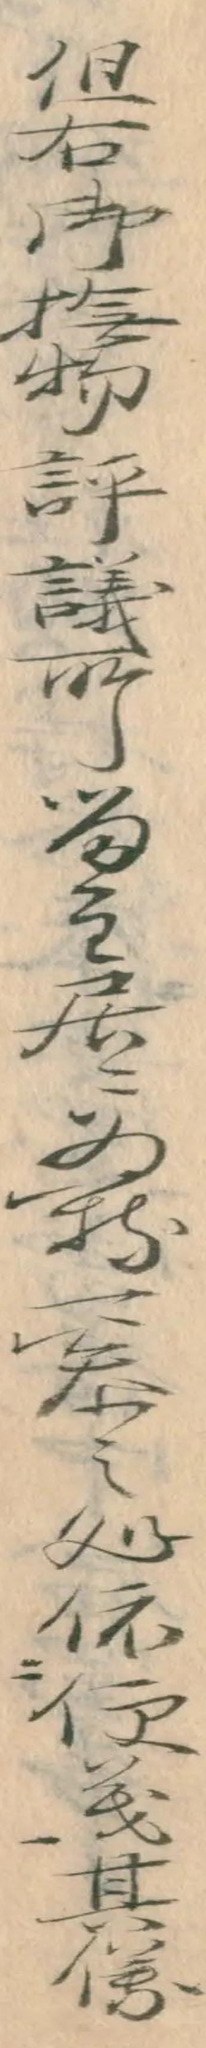但右御撫物評議所留主居ニ為持可参之処依之便義其儀
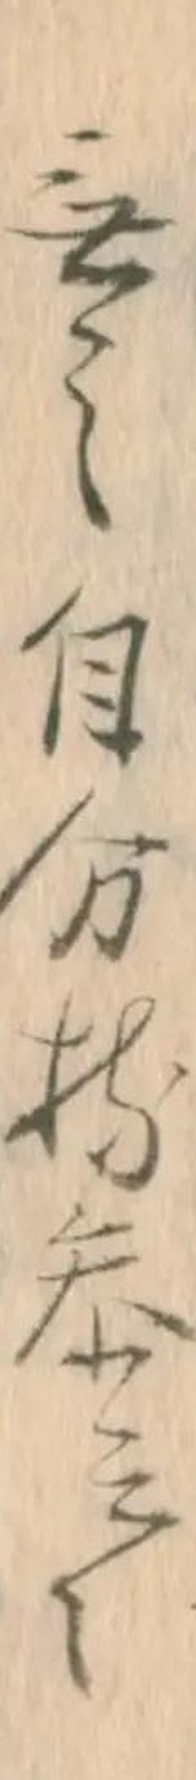無之自分持参云々
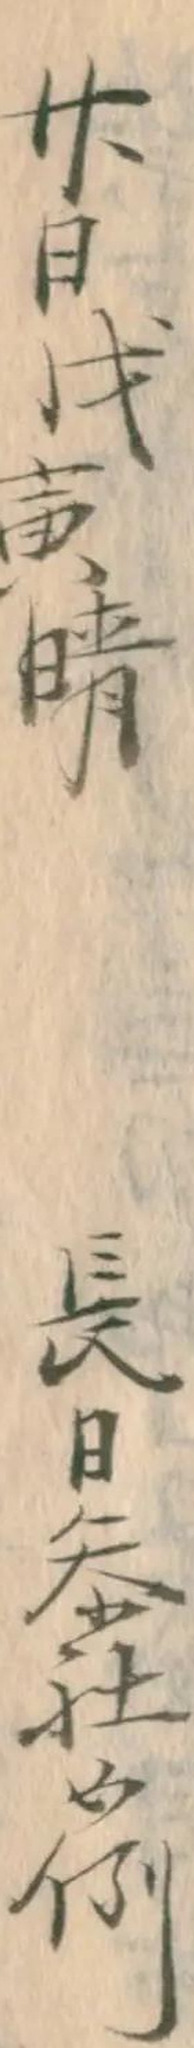廿日戊寅晴長日参社如例
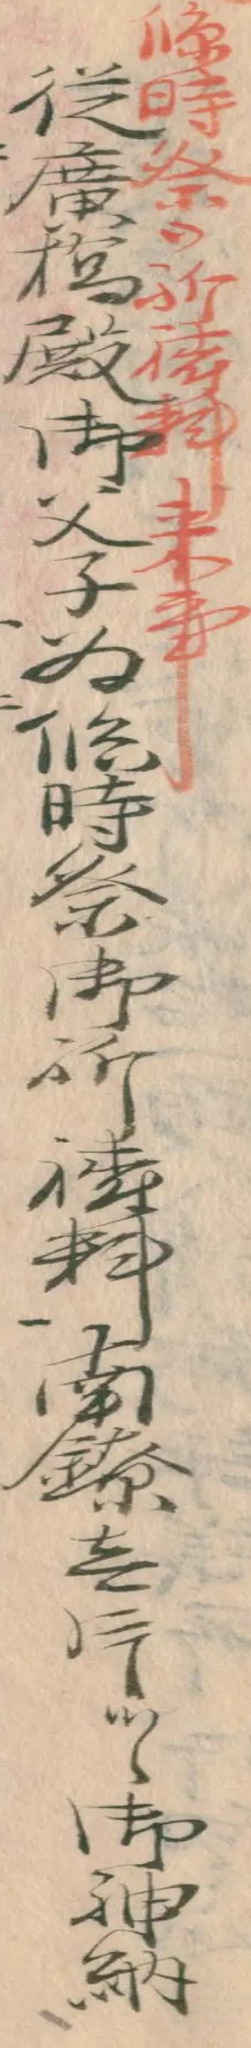一従廣橋殿御父子為臨時祭御祈祷料南鐐壱片ツヽ御神納
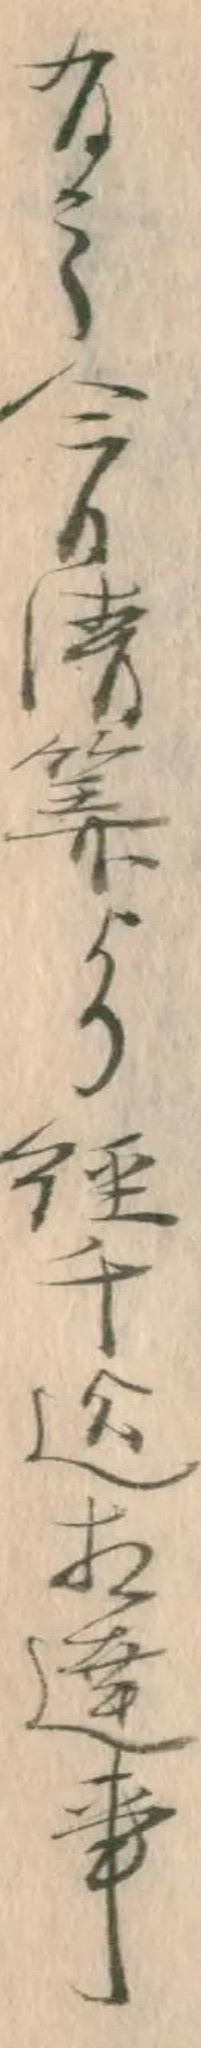有之今日清筭より経千迄相達事
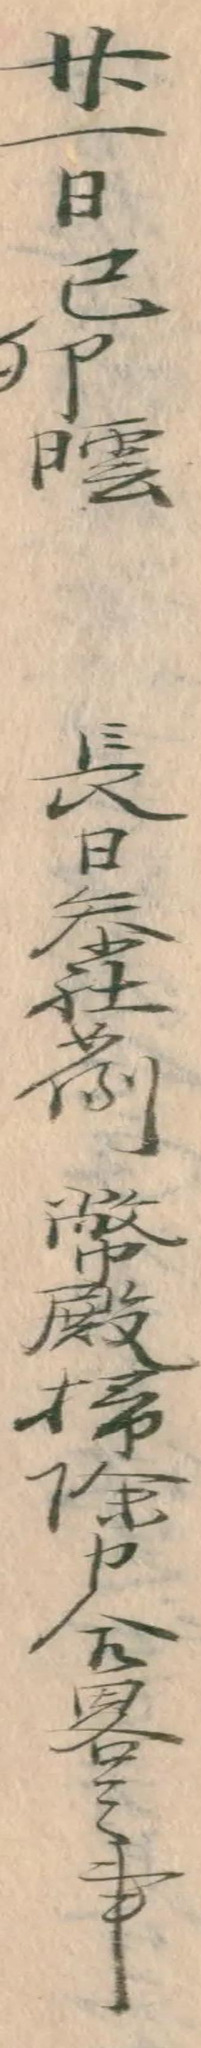廿一日已卯曇長日参社如例幣殿掃除申合畧之事
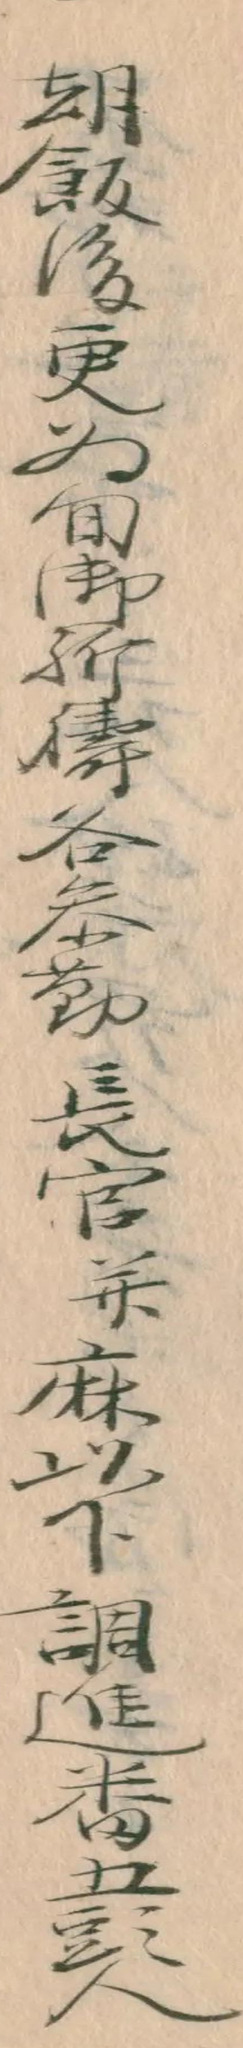一朝飯後更為旬御祈祷各参勤長官并麻以下調進番五頭人
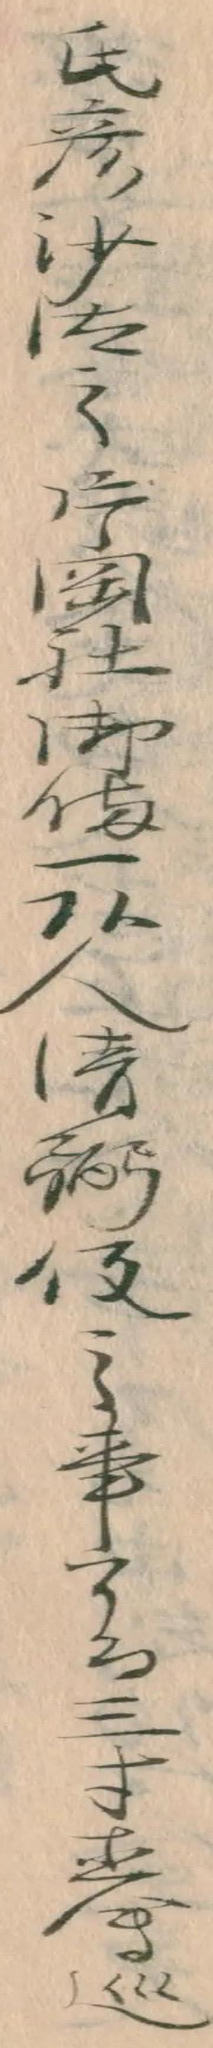氏彦沙汰之片岡社御備一頭人清弼役之事了而三寸直會巡
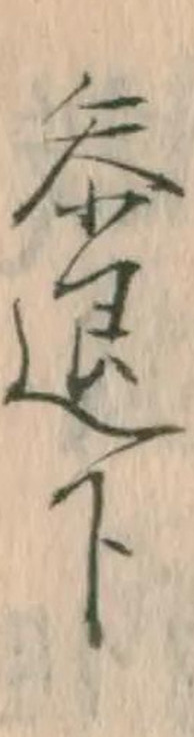参退下
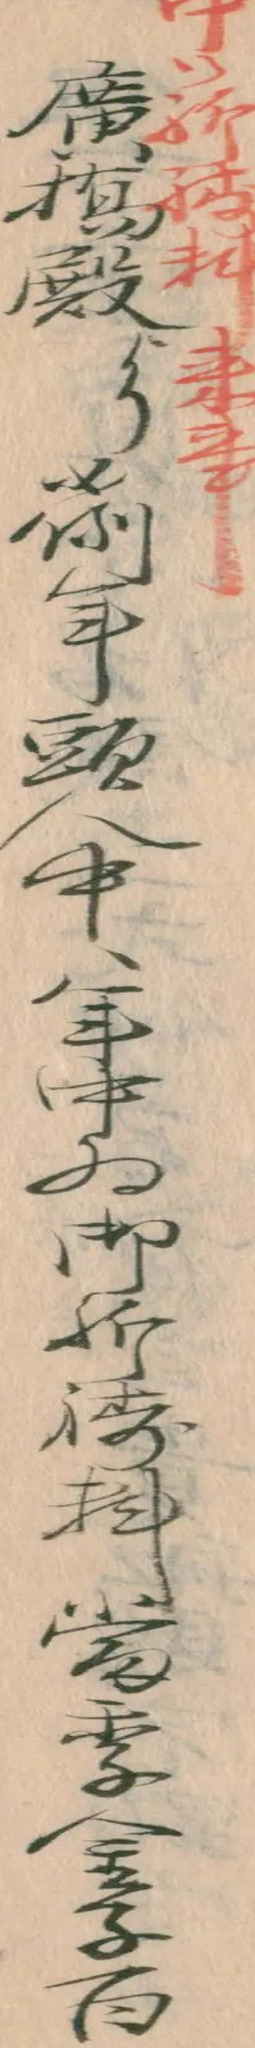一廣橋殿より如例年頭人中は年中為御祈祷料當季金子百
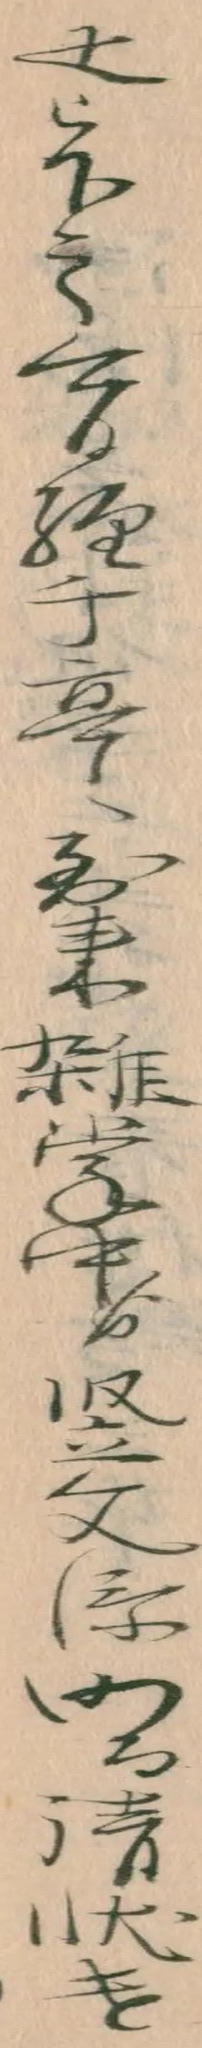疋被下之今日経千亭へ到来雑掌中ゟ竪文添仍而請状遣之事
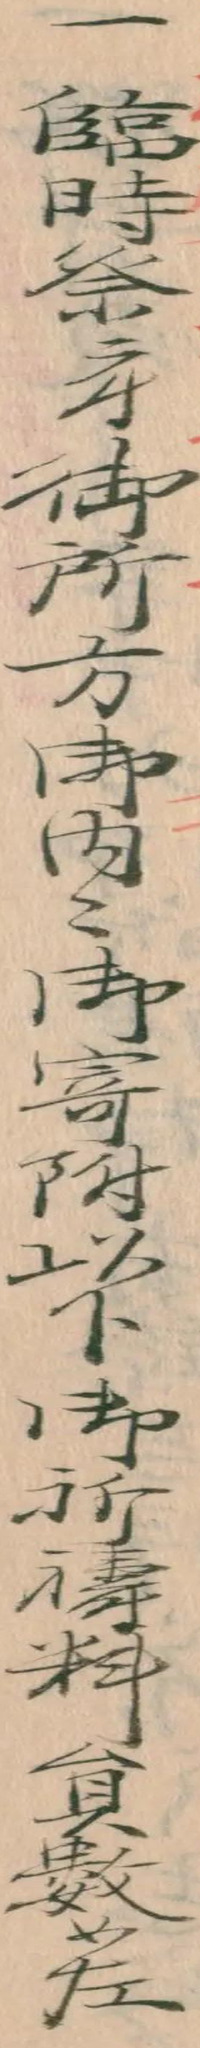一臨時祭ニ付御所方御内々御寄附以下御祈祷料員数如左
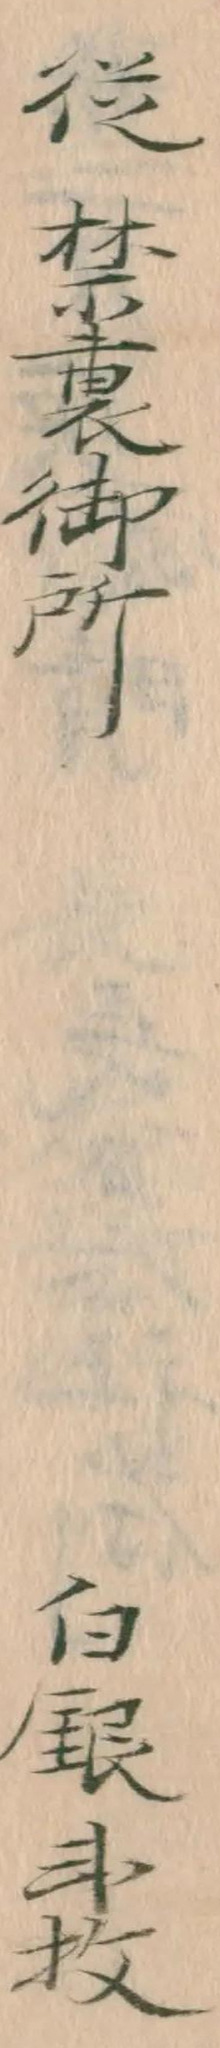従禁裏御所白銀弐枚
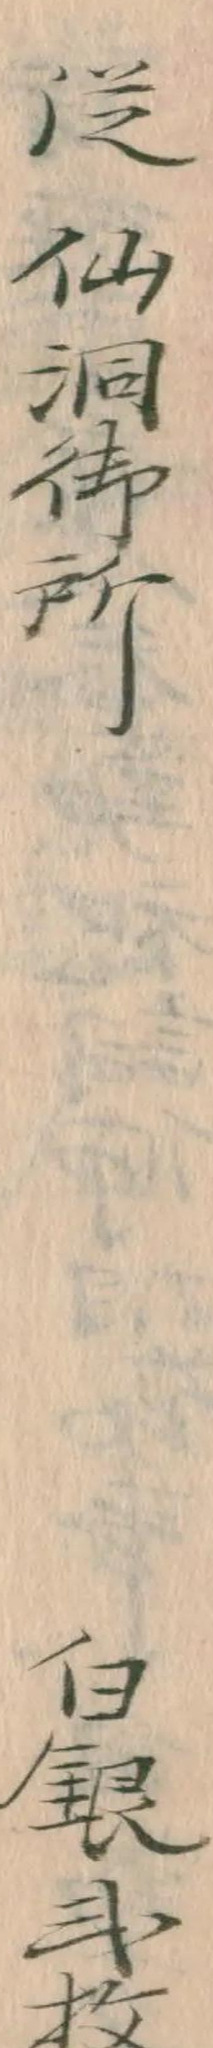従仙洞御所白銀弐枚
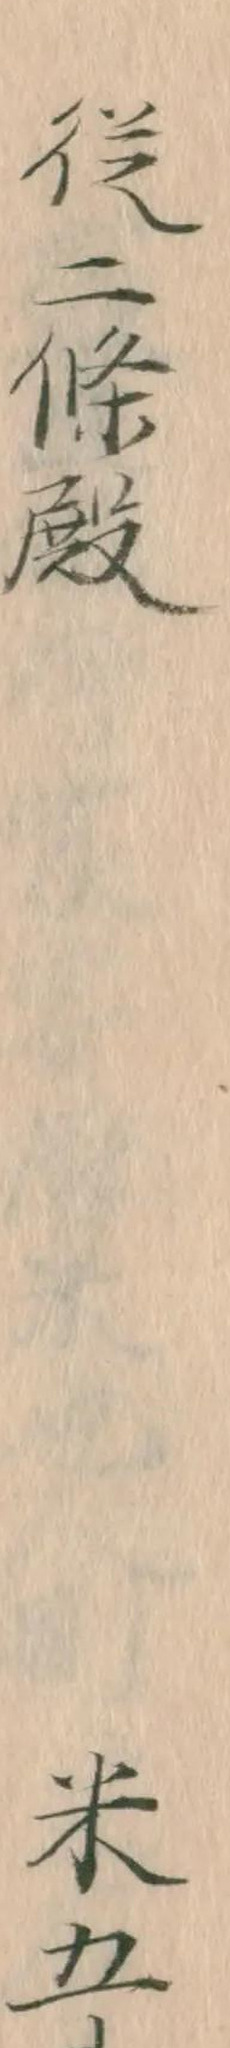従二條殿米五斗
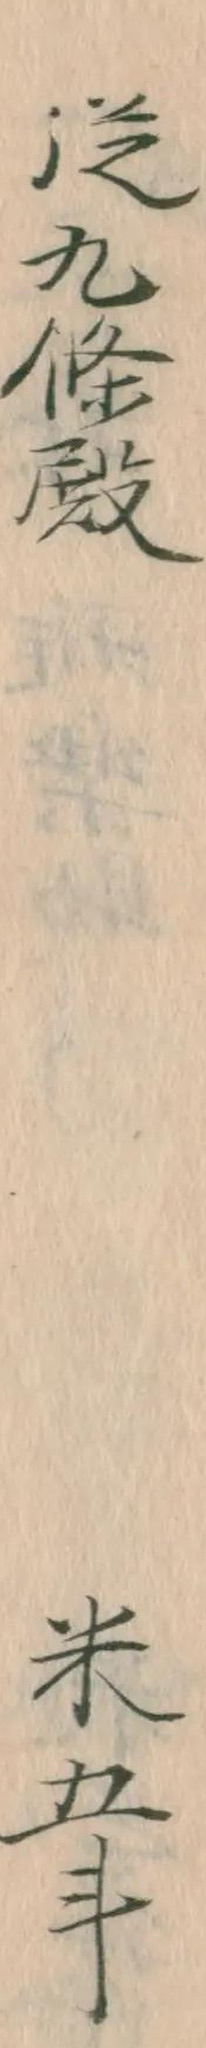従九條殿米五斗
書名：賀茂社記録. 第74冊
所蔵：国立国会図書館 National Diet Library, JAPAN
